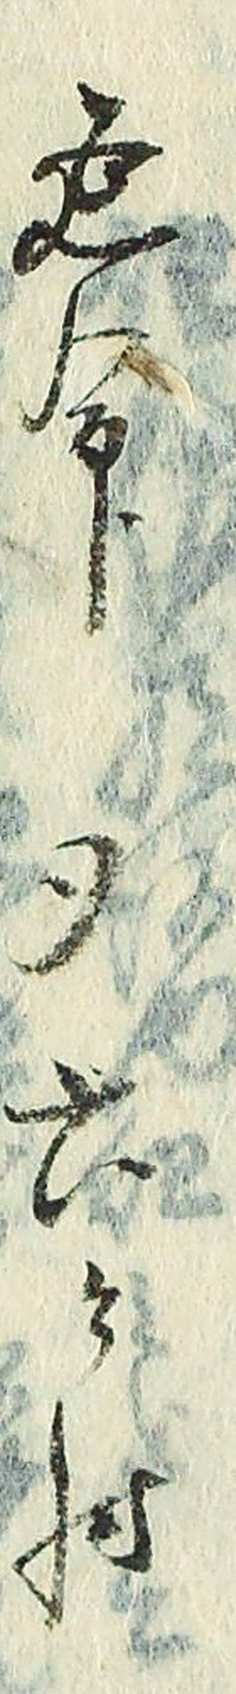延命〆六ケ村
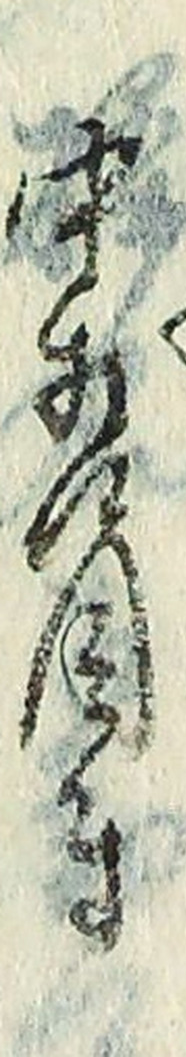中村郷目付
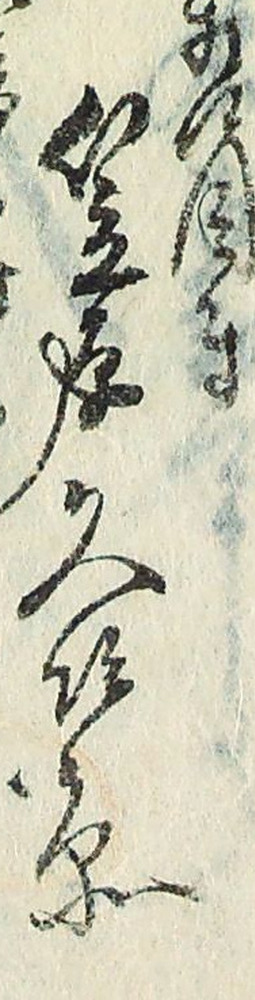笠原久治兵衛
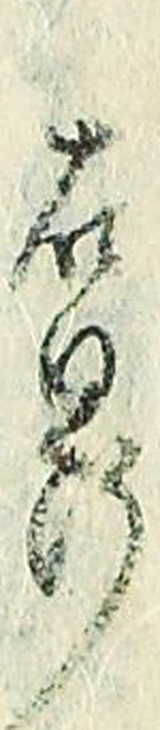右同断
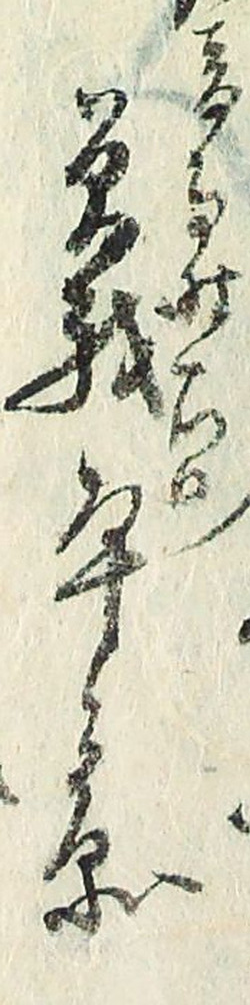曽我平兵衛
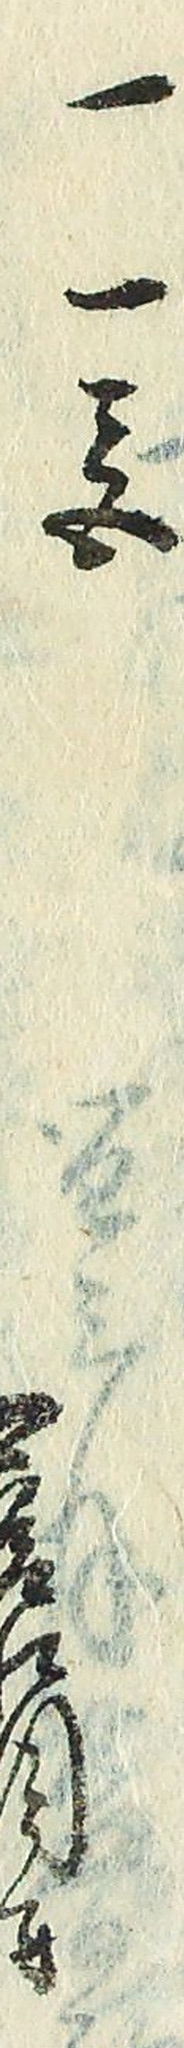一一宮一宮郷目付
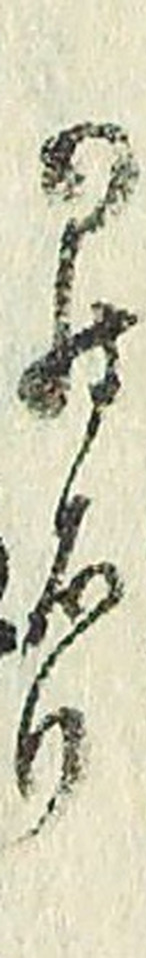同村右同
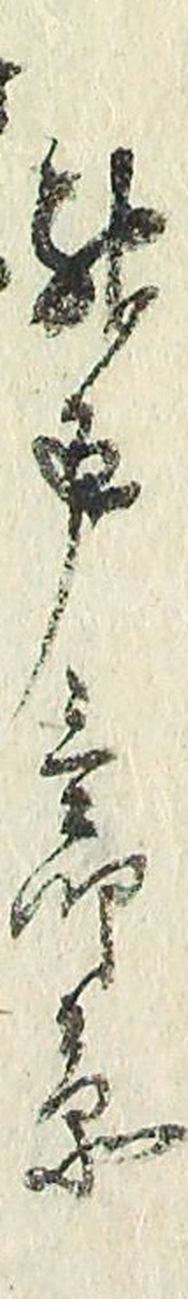神原三郎兵衛
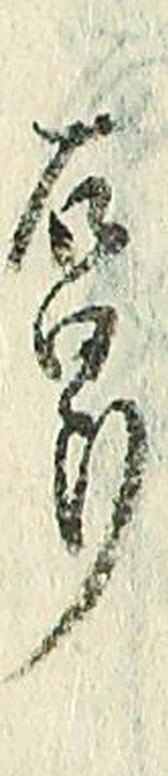右同断
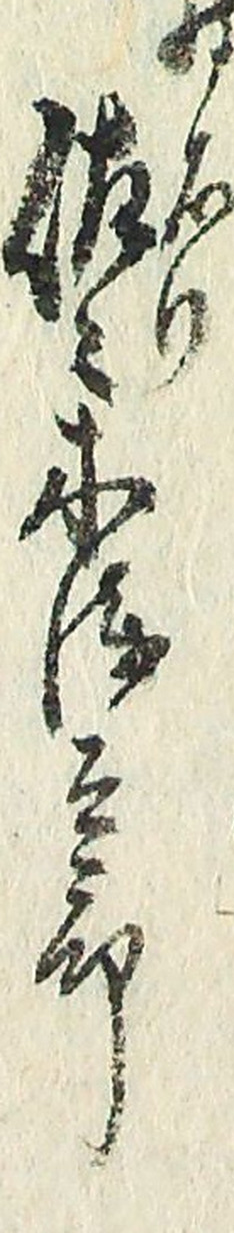佐々木陣太郎
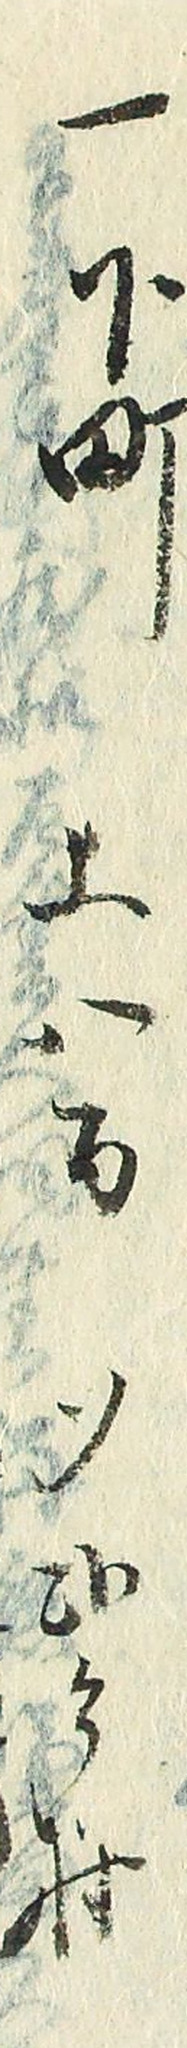一下町上八万〆弐ケ村
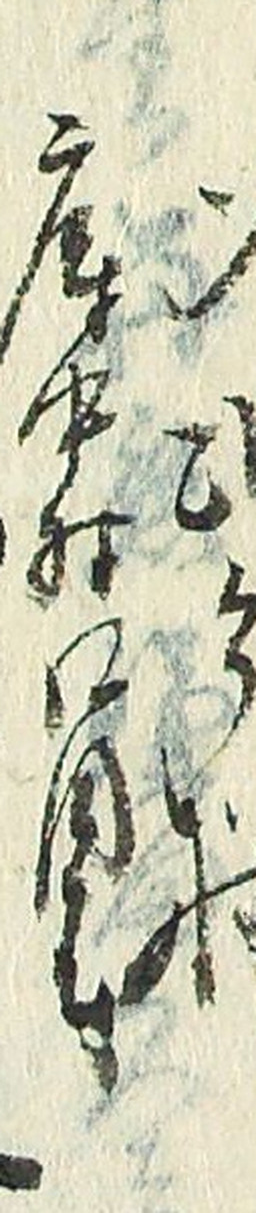府中村郷目付
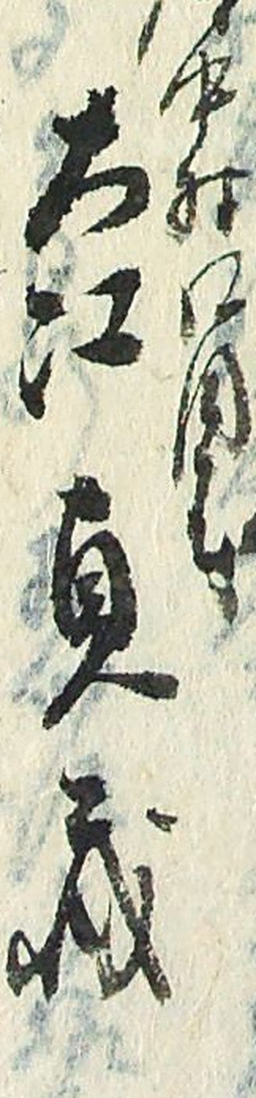大江貞蔵
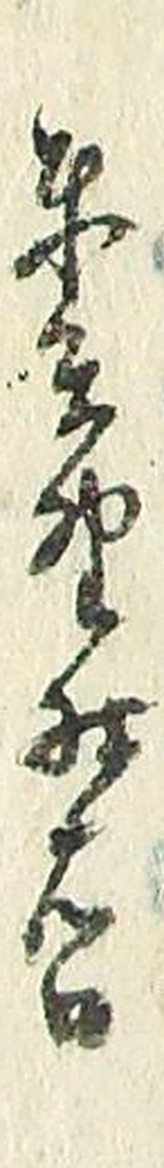東矢野村右同
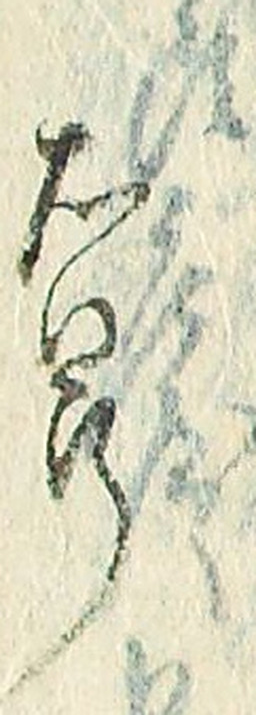右同断
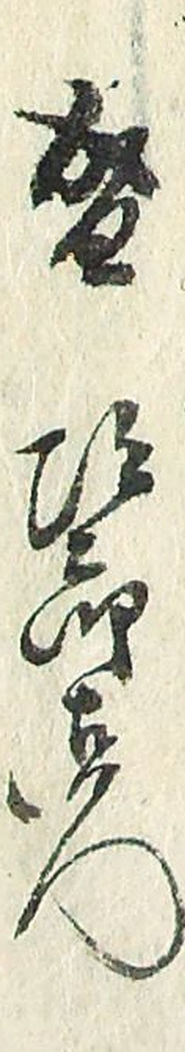盛次郎左衛門
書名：諸御趣意書并御下知向之写
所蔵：鳴門教育大学 Naruto University of Education
